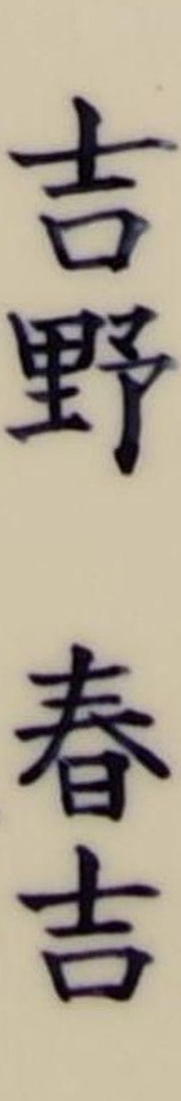吉野春吉
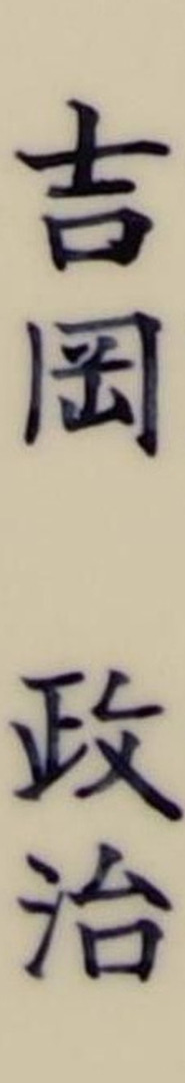吉岡政治
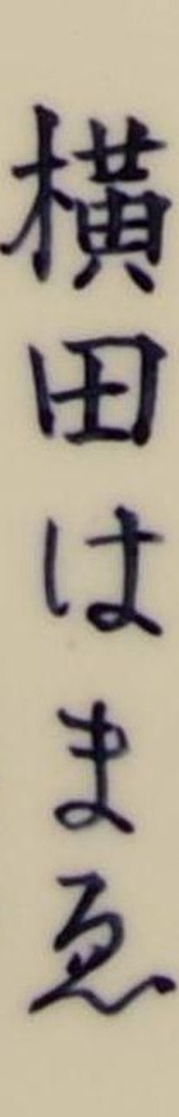横田はまゑ
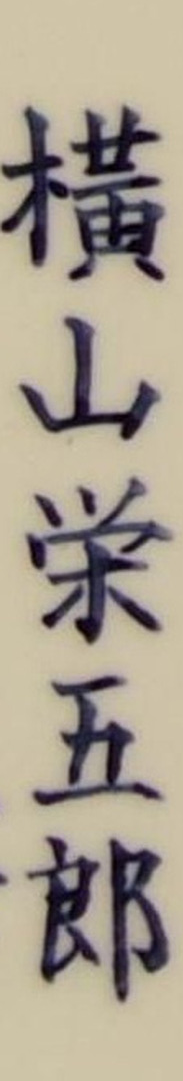横山栄五郎
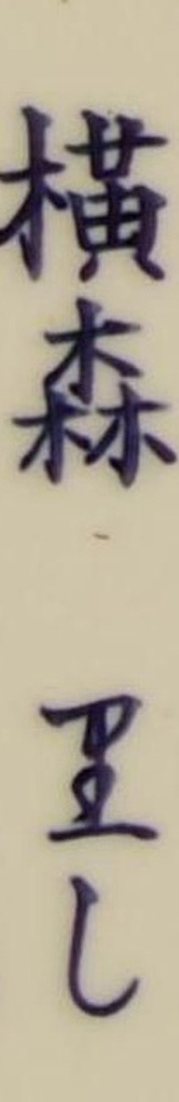横森りし
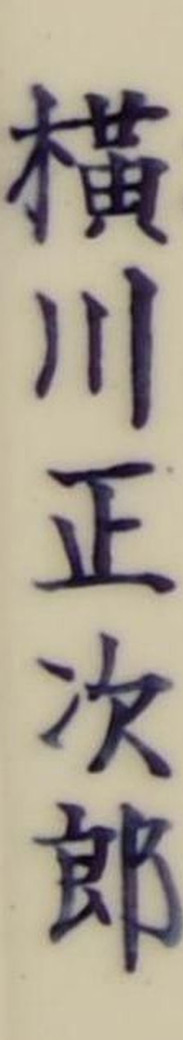横川正次郎

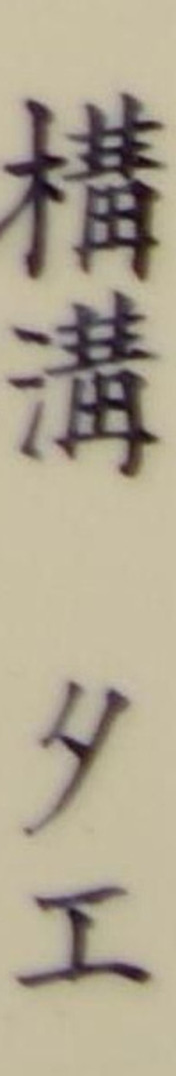構溝タ工
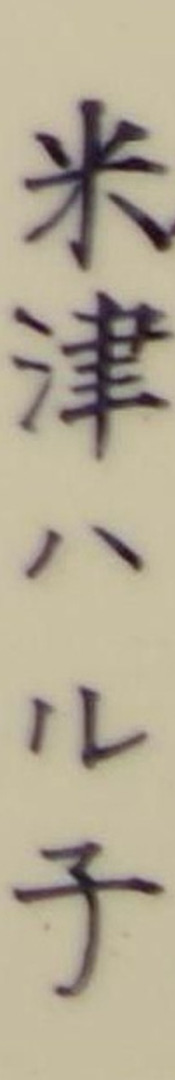米津ハル子
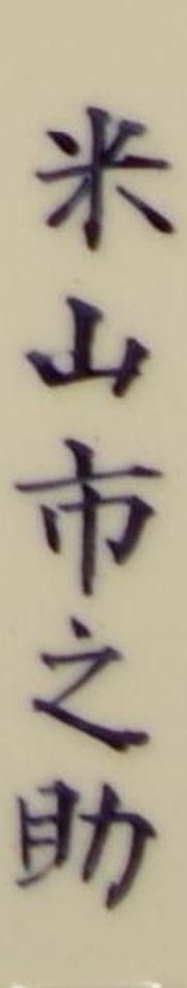米山市之助
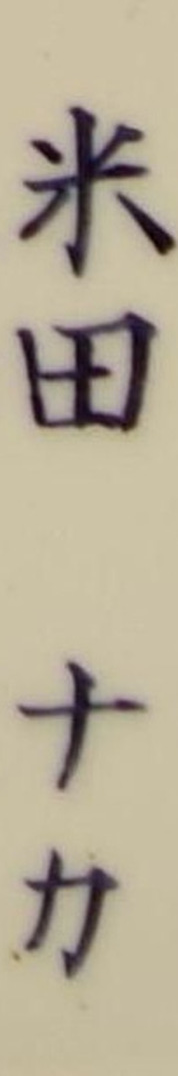米田ナカ
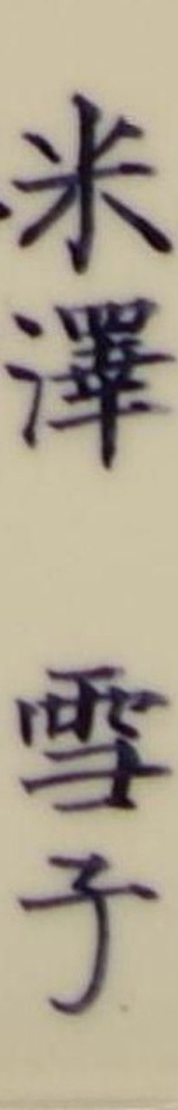米澤雪子
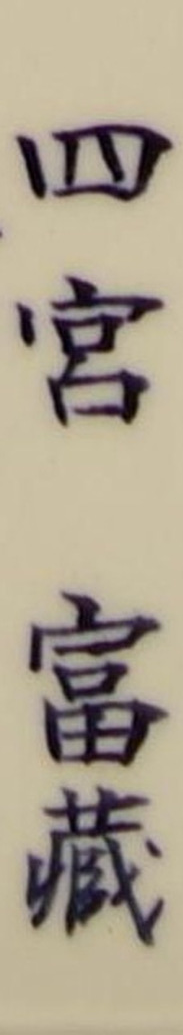四宮富蔵
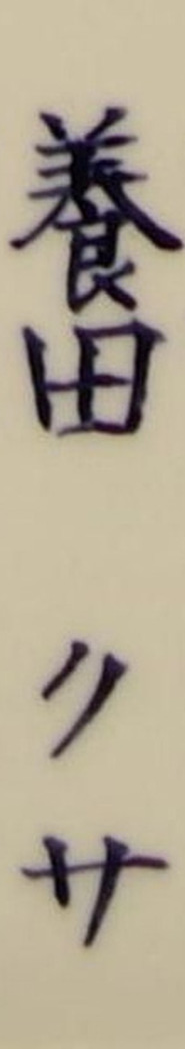養田クサ
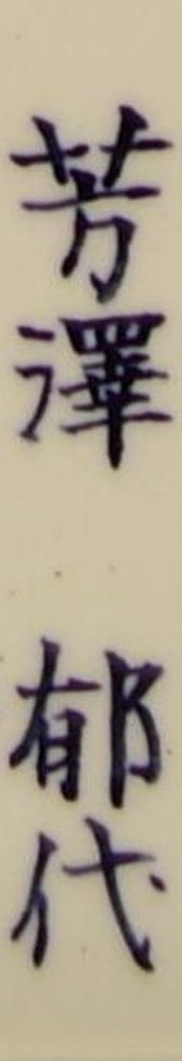芳澤都代
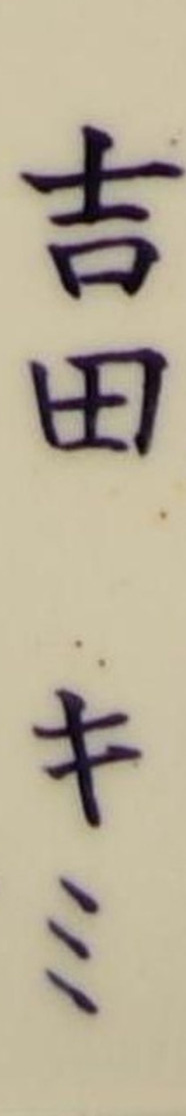吉田キミ
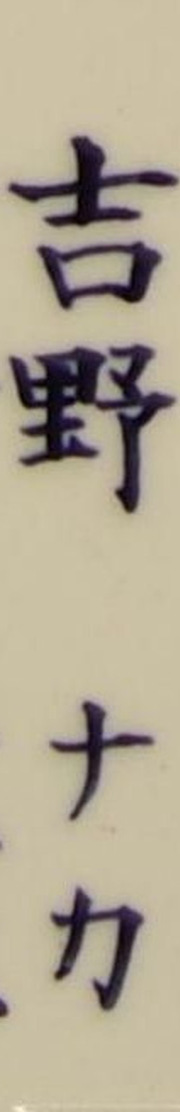吉野ナカ
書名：E~L
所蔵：高野山金剛峯寺
